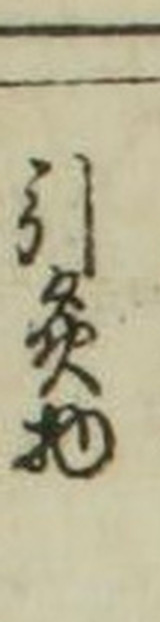引炙物
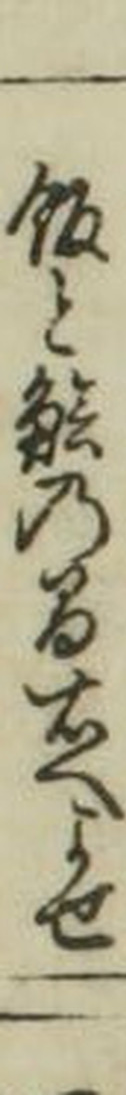飯と鱠の間右へよせ
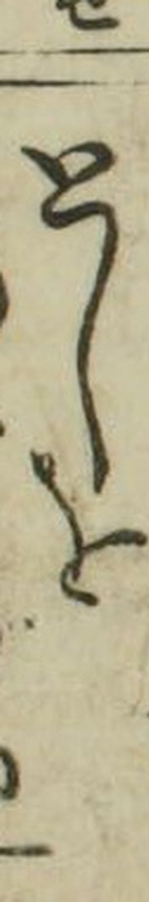としを
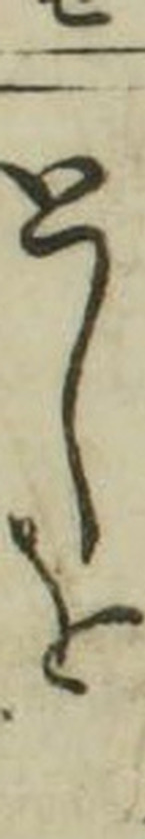としを
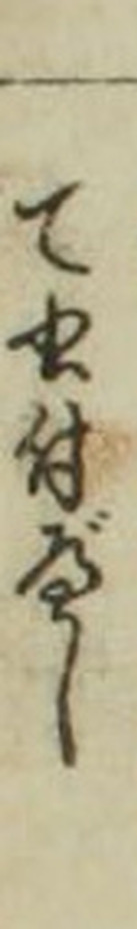て書付べし
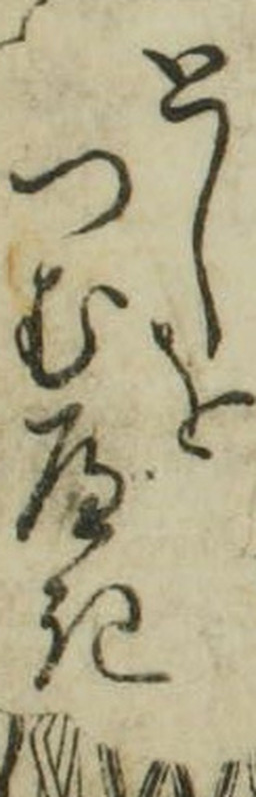つむへき
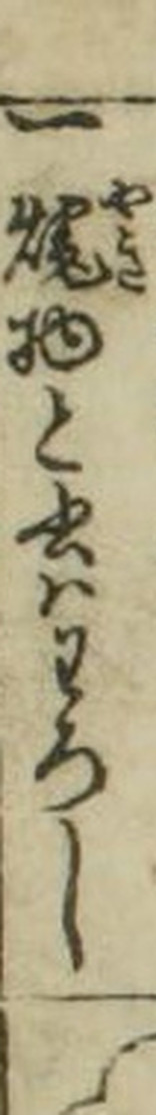一焼物と書はわろし

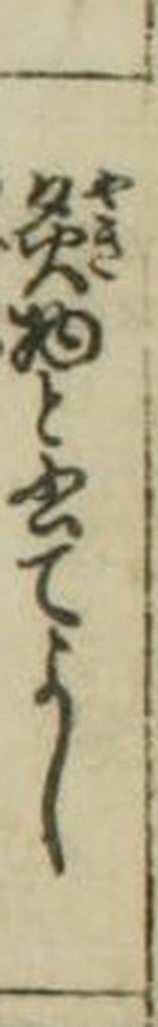炙物と書てよし
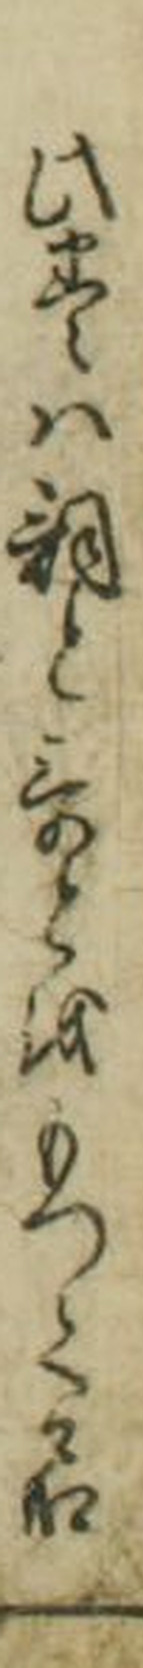此巻は詞と哥とをもつて名
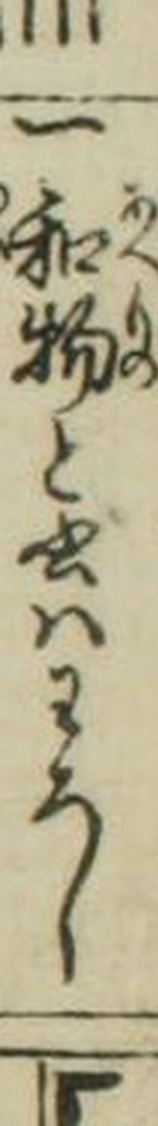一和物と書はわろし
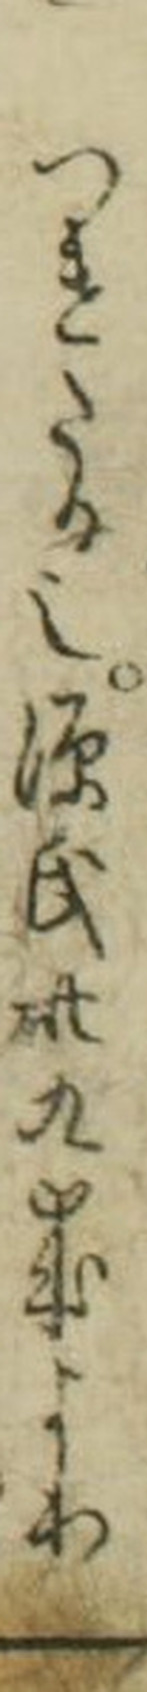つけたる也。源氏卅九歳より
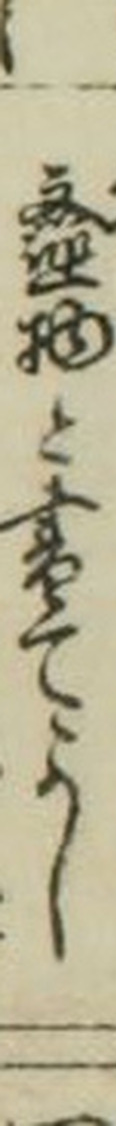炙物と書てよし
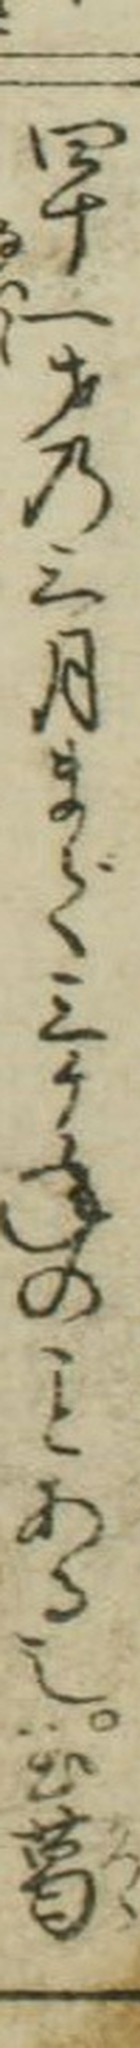四十一才の三月まで三ヶ年のことある也。玉葛
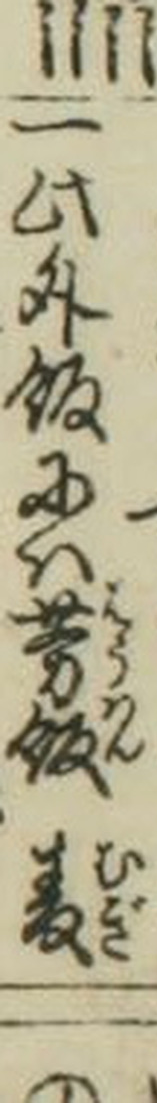一此外飯には芳飯麦
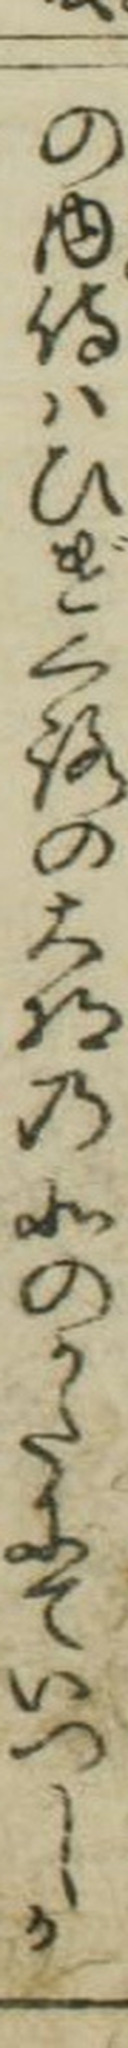の内侍はひげくろの大将の北のかたにていつしか
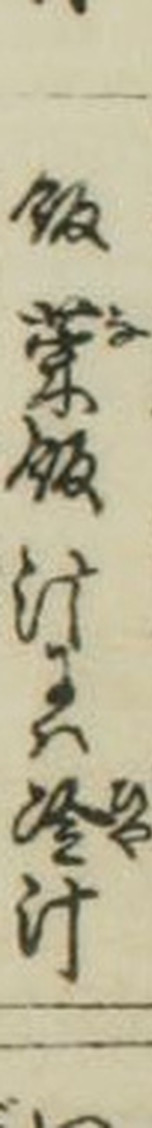飯菜飯汁には冷汁
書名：女源氏教訓鑑
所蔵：東京学芸大学附属図書館
